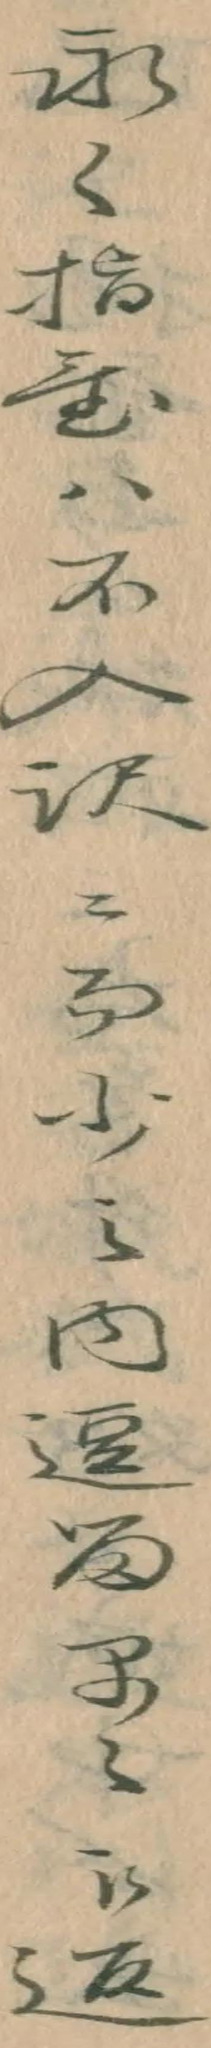永く指置は不入訳に而少之内逗留早々被返
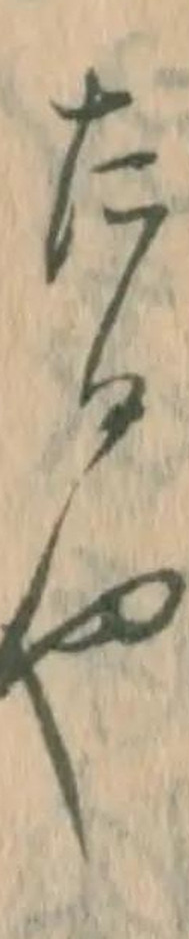たる也
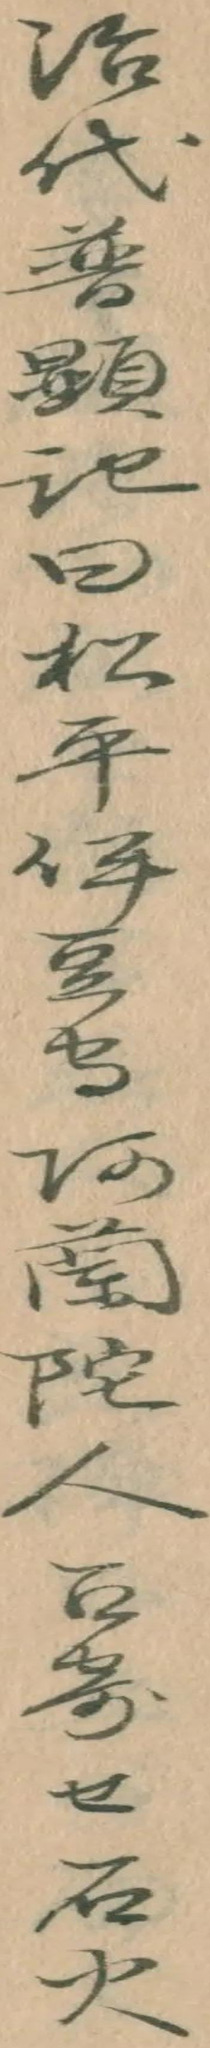治代普顕記曰松平伊豆守阿蘭陀人召寄せ石火
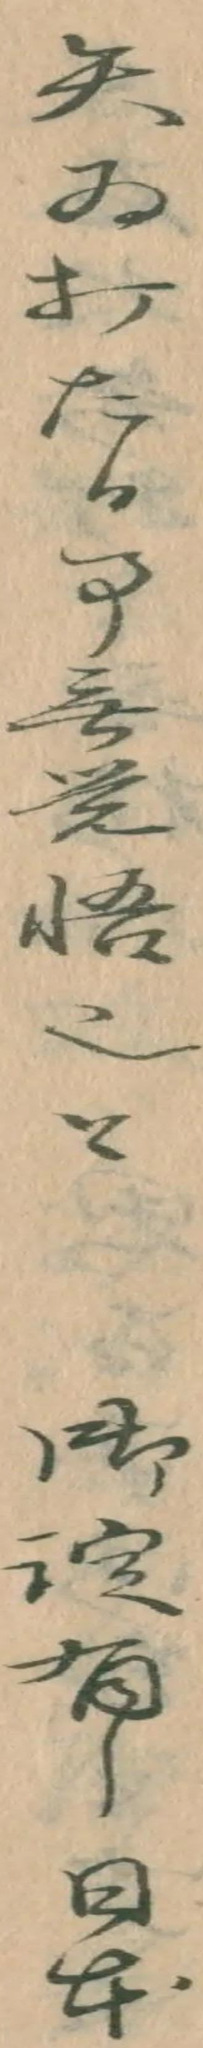矢ゐ打たる事無覚悟也と御諚有し日本

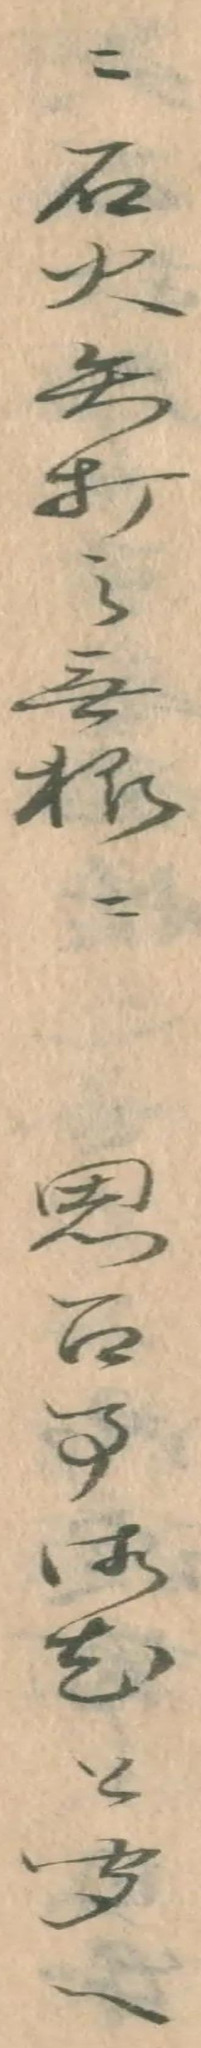に石火矢打之無様に思召事御尤と聞へ
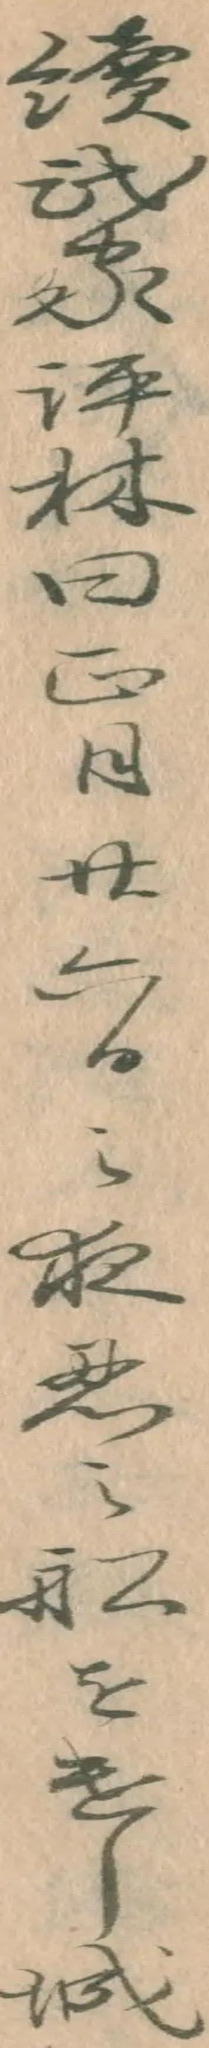続武家評林曰正月廿六日之夜忍之舩を遣し城
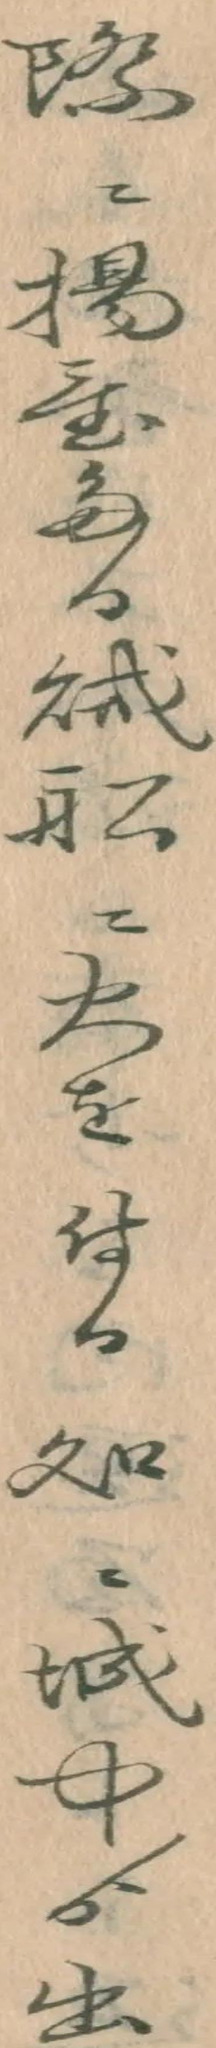際に揚置多る賊舩に火を付る処に城中ゟ出
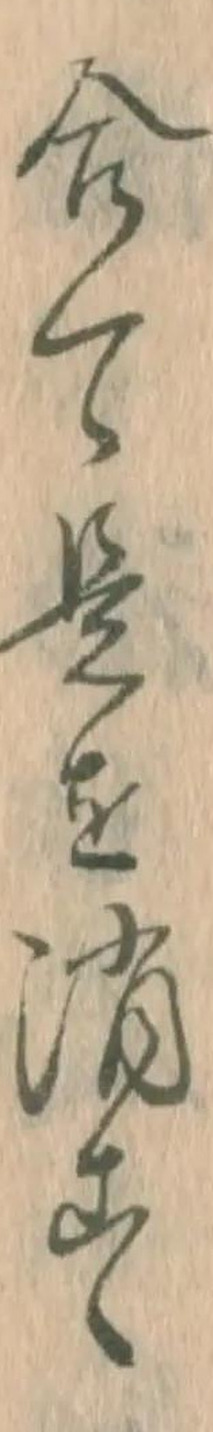合て是を消春
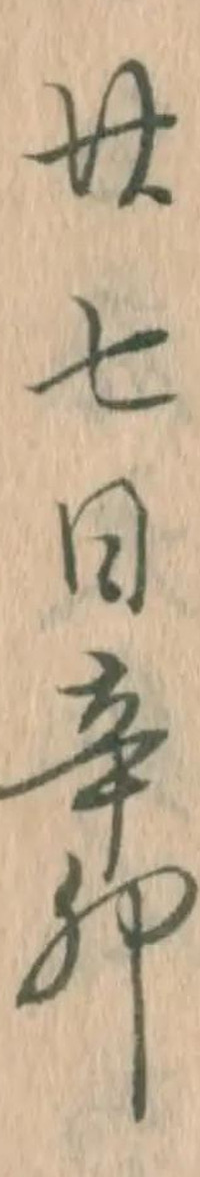廿七日辛夘
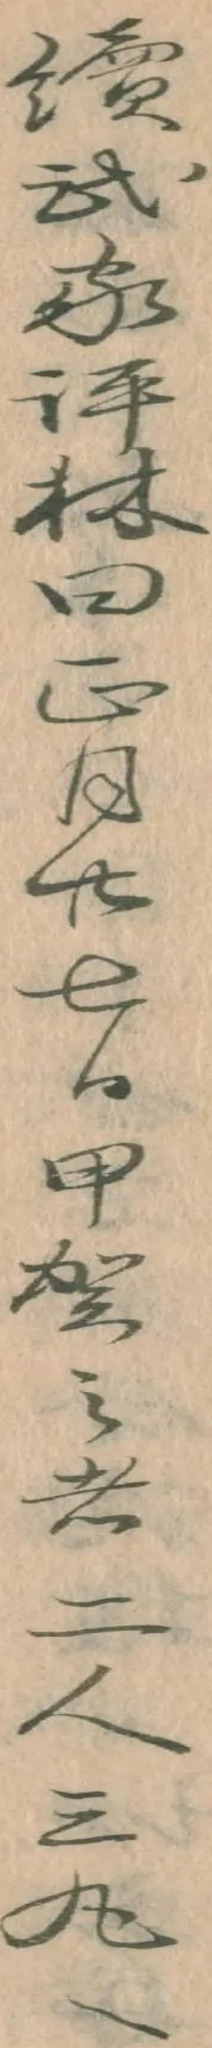続武家評林曰正月廿七日甲賀之者二人三丸へ
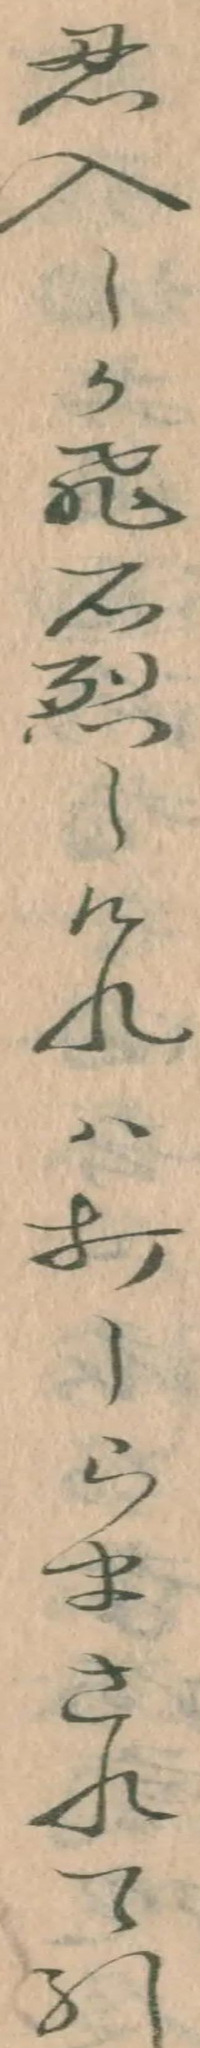忍入しか飛石烈しけれは打しらまされて引
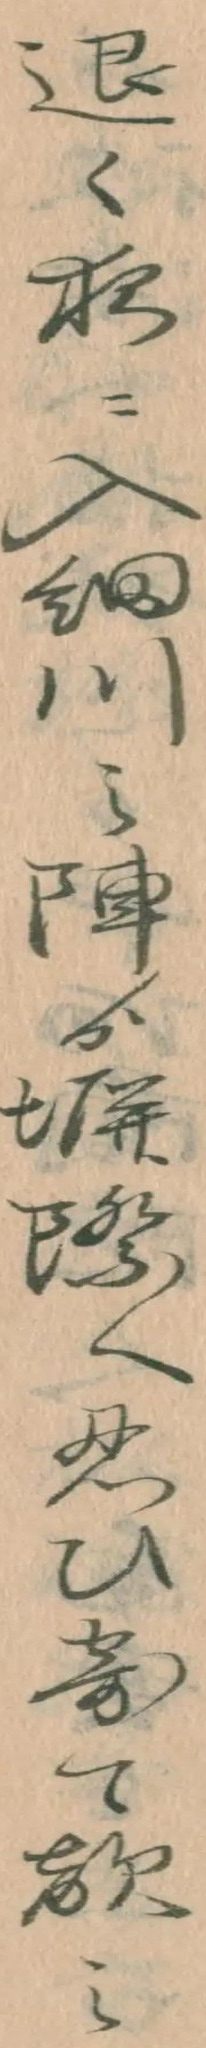退く夜に入細川之陣ゟ塀際へ忍ひ寄て敵之
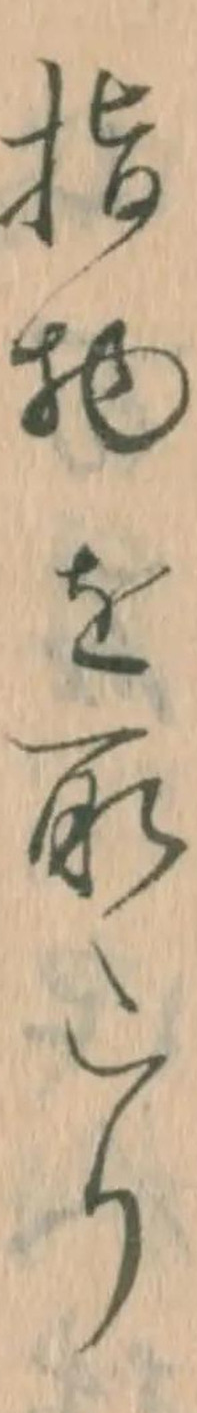指物を取たり
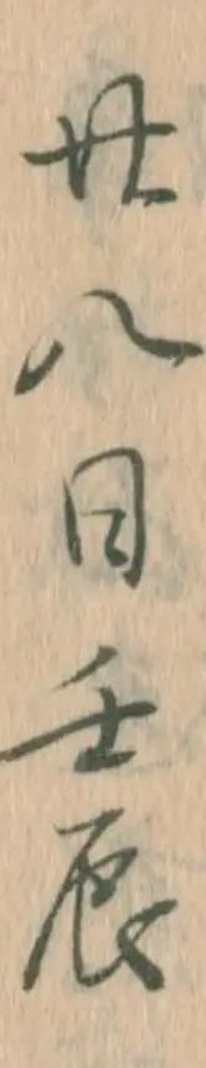廿八日壬辰
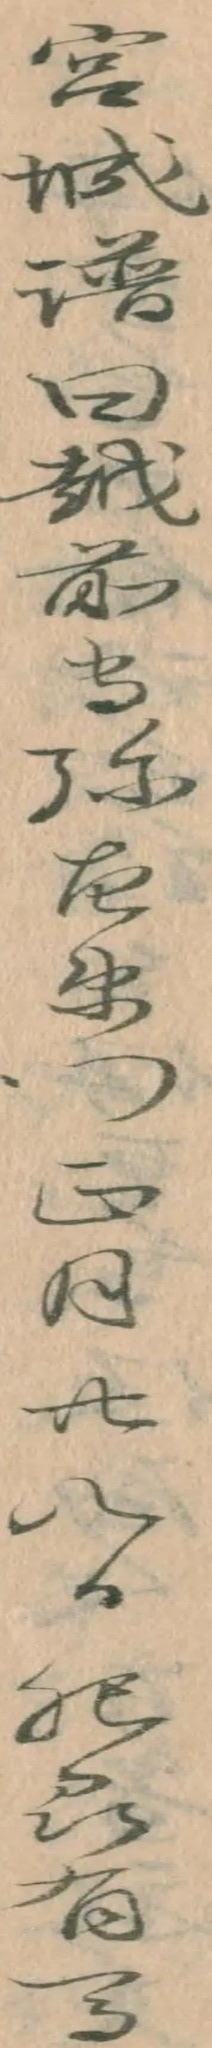宮城譜曰越前守弥左衛門正月廿八日肥州有馬
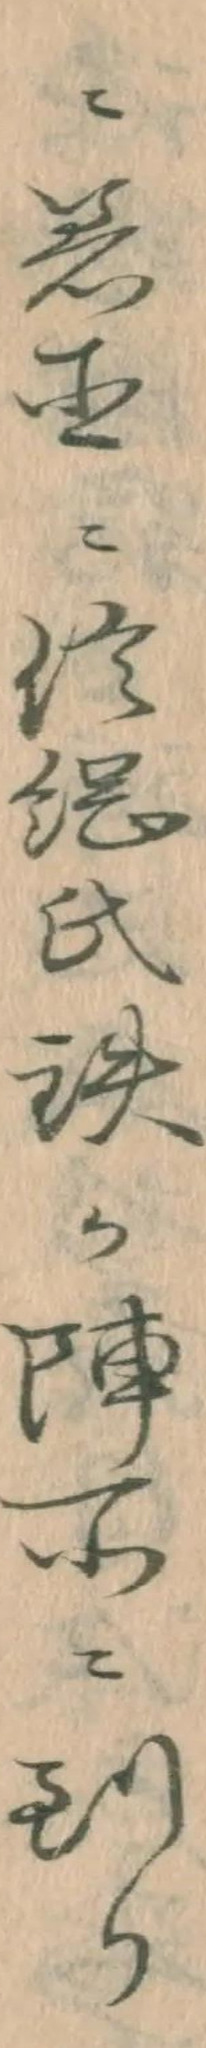に着直に信綱氏鉄か陣所に到り
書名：切支丹御退治記 49巻. [6]
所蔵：国立国会図書館 National Diet Library, JAPAN
